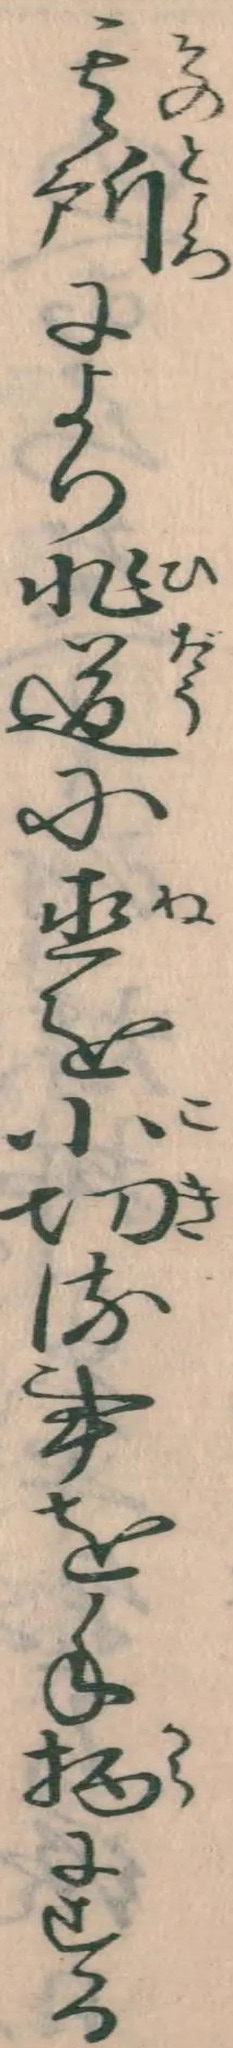其所により非道に直を小切る事を手柄にする
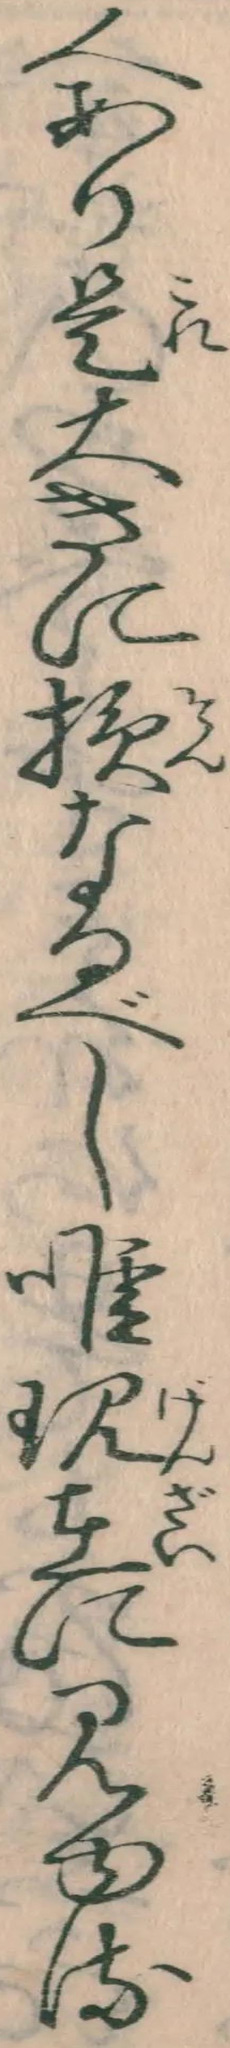人あり是大きに損なるべし唯現在に見ゆる
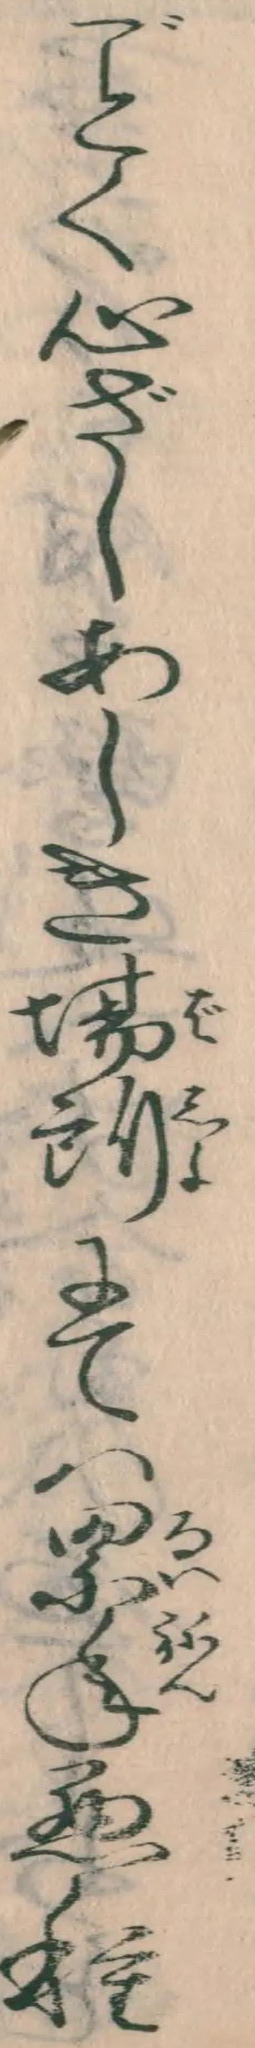ごとく心ざしあしき場所にては累年悪種
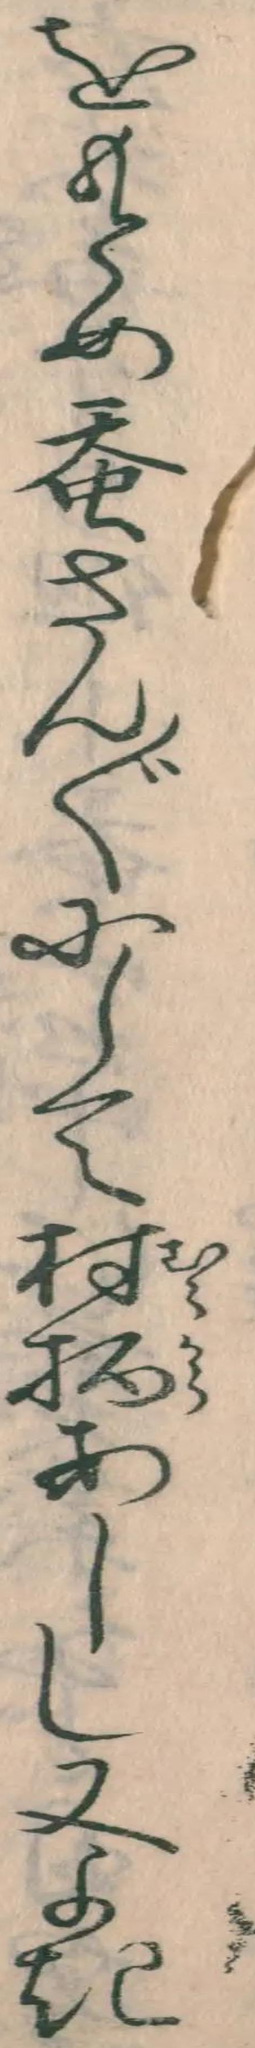をもとめ蚕さん〴〵にして村柄あしし又よき
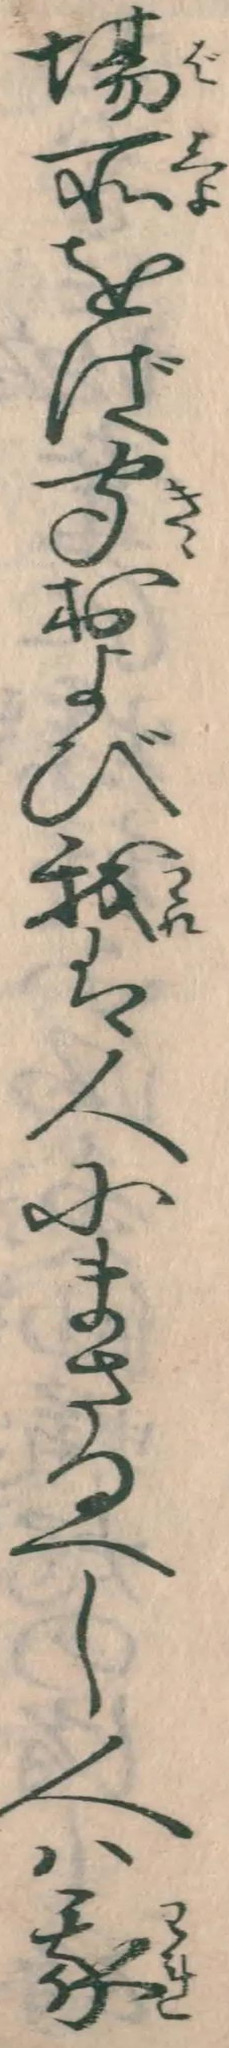場所をば聞および我は人にまさるへし人は我
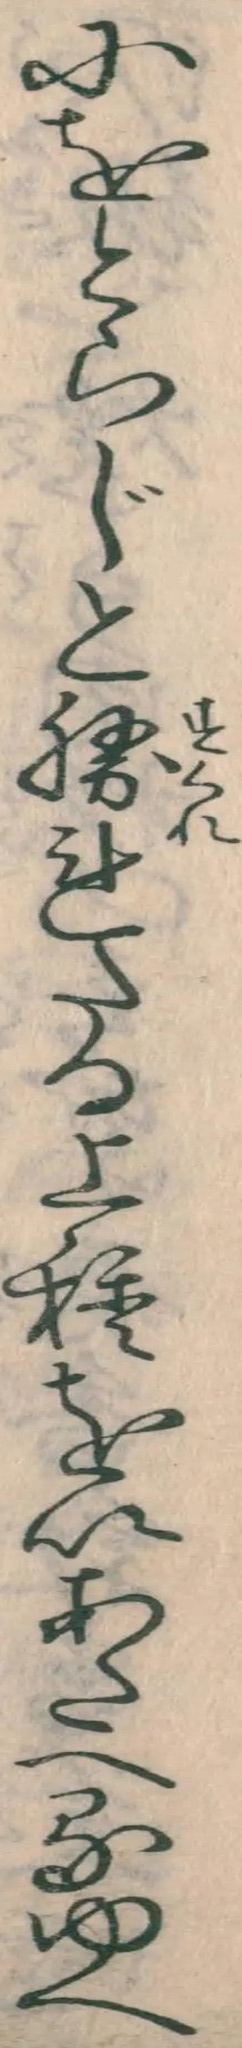にをとらじと勝れたる上種を以あたへるゆへ
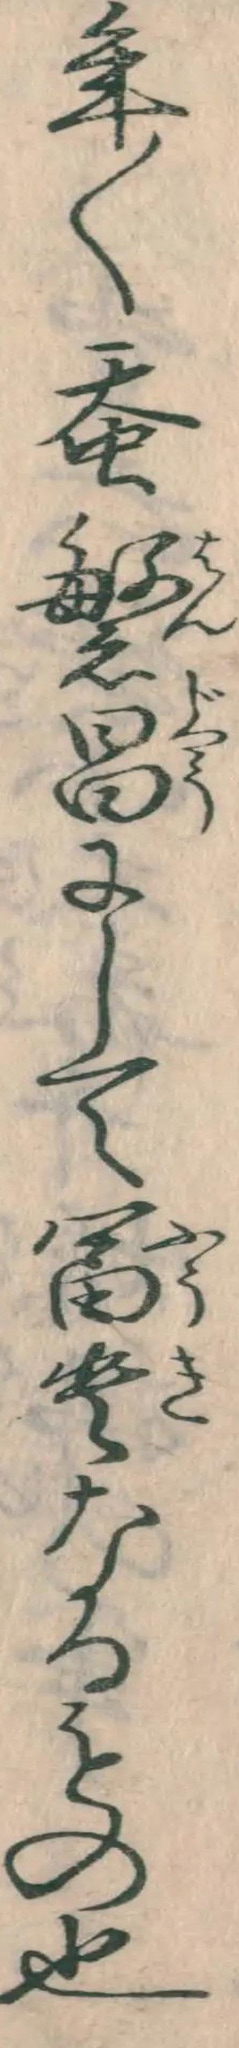年〳〵蚕繁昌にして富貴なるもの也

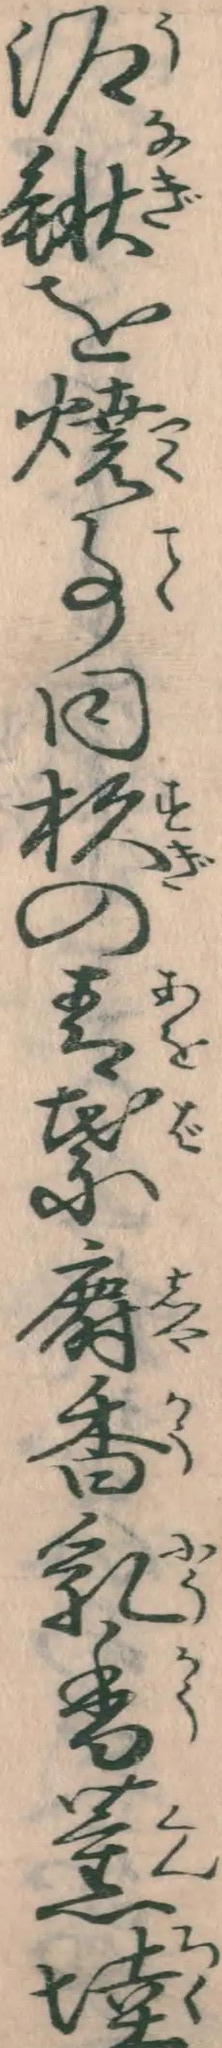泥鰍を焼事同杉の青葉麝香乳香薫陸
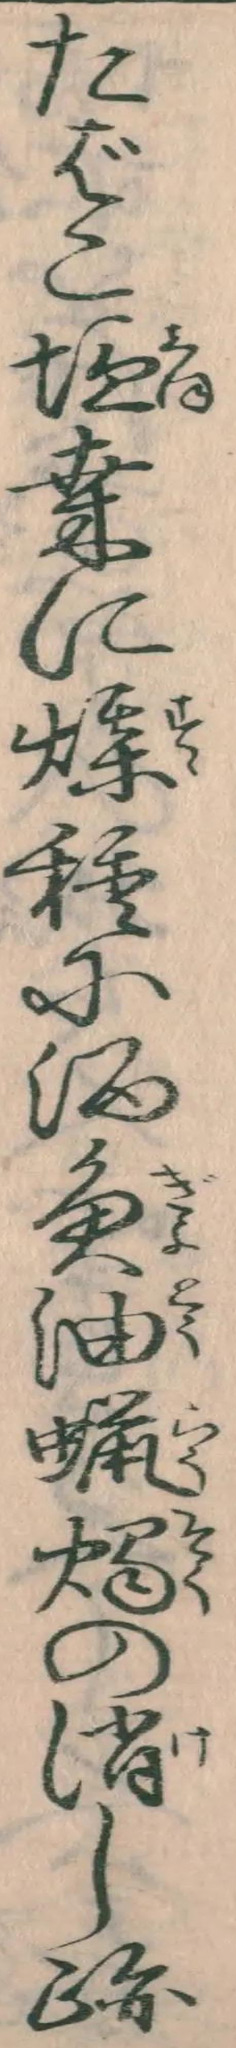たばこ塩桑に煤種に酒魚油蝋燭の消し跡
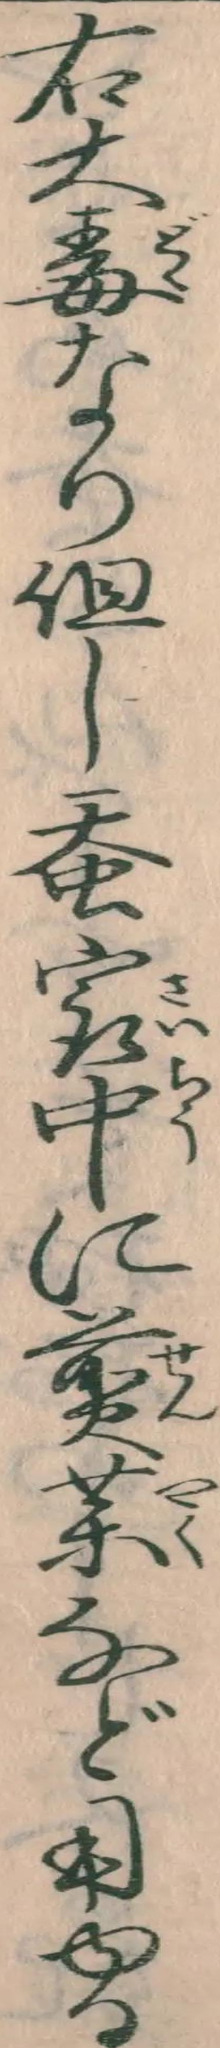右大毒なり但し蚕最中に煎薬など用ゆる
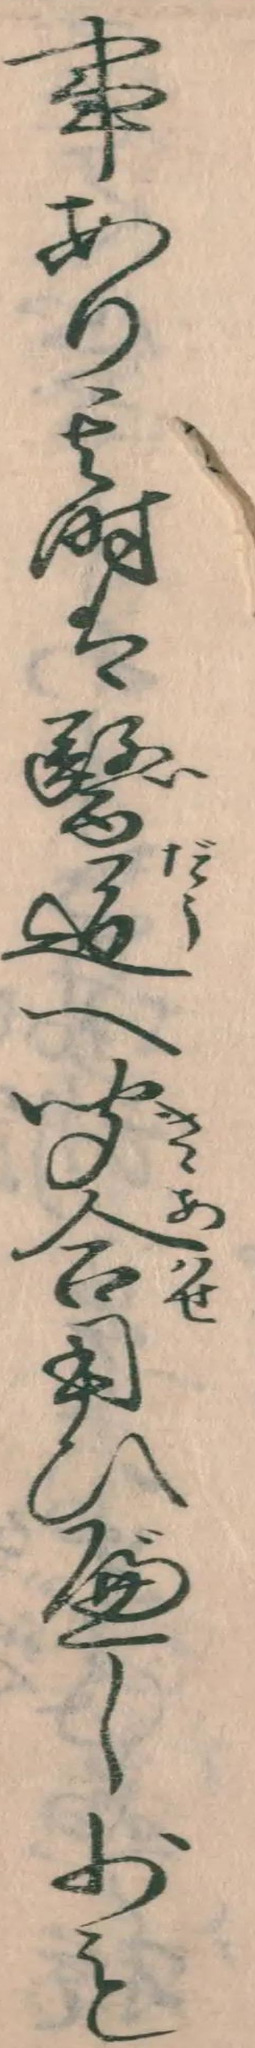事あり其時は医道へ聞合用ひべし少も
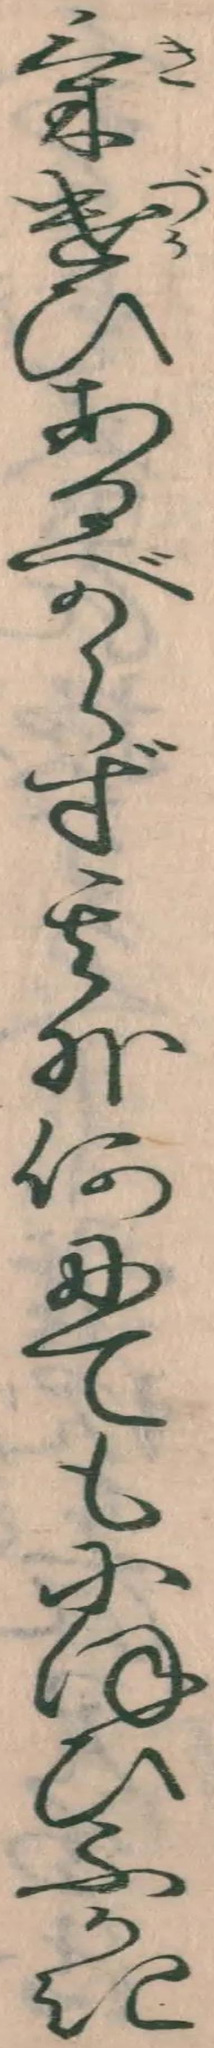気遣ひあるべからず其外何にてもにほひふかき
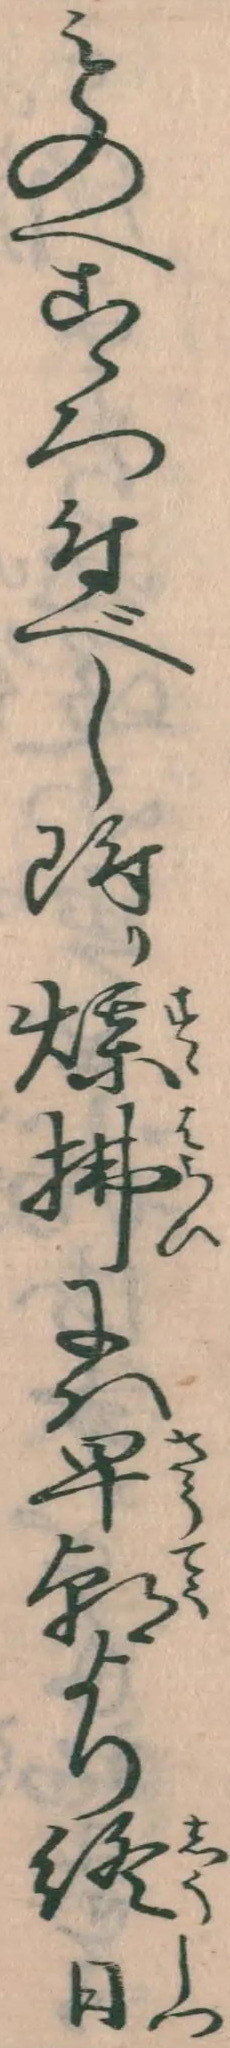ものへこゝろ付べし附り煤払には早朝より終日
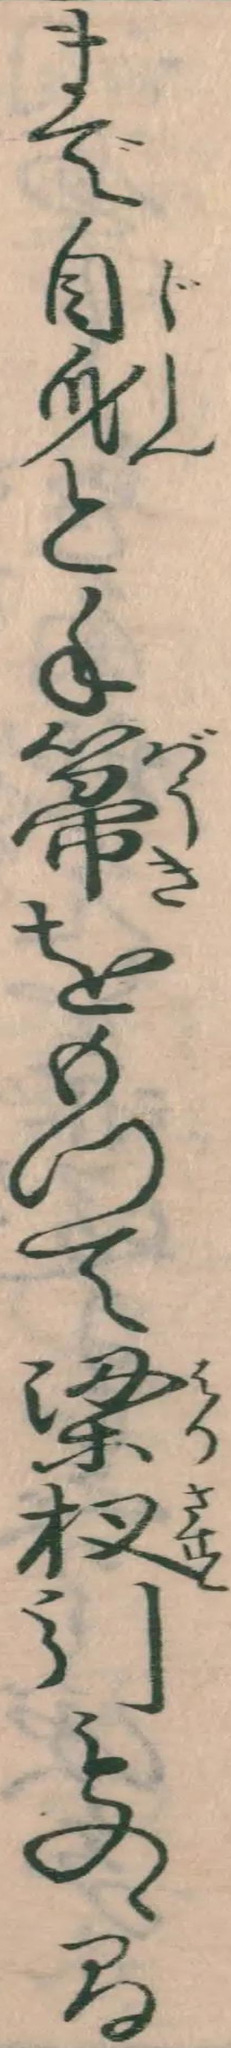まで自身と手箒をもつて梁扠引ものゝ間
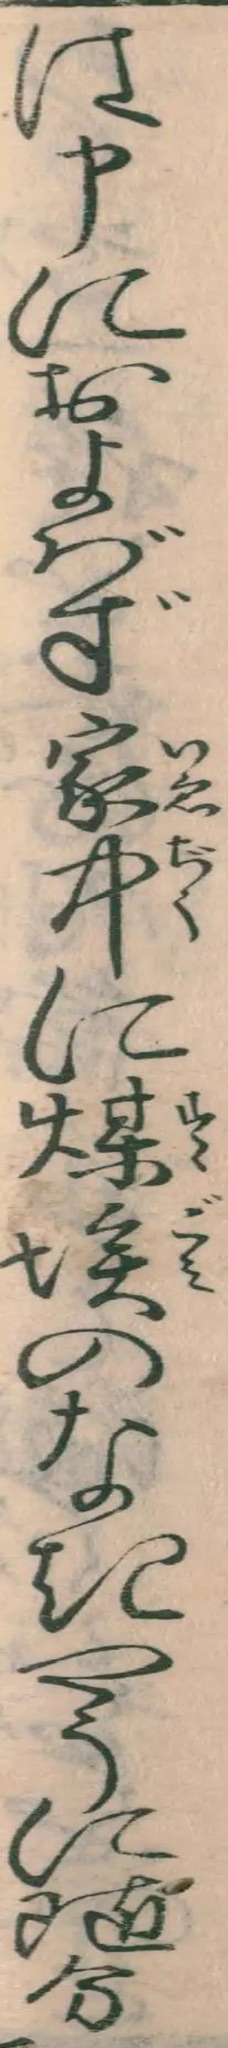は申におよばず家中に煤埃のなきやうに随分
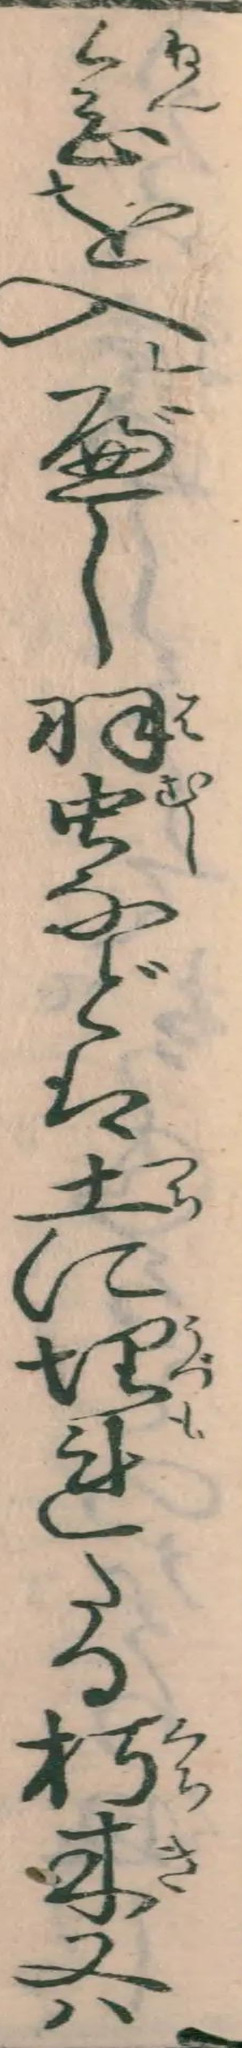念を入れべし羽虫などは土に埋れたる朽木又は
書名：新撰養蚕秘書
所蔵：国立国会図書館 National Diet Library, JAPAN
